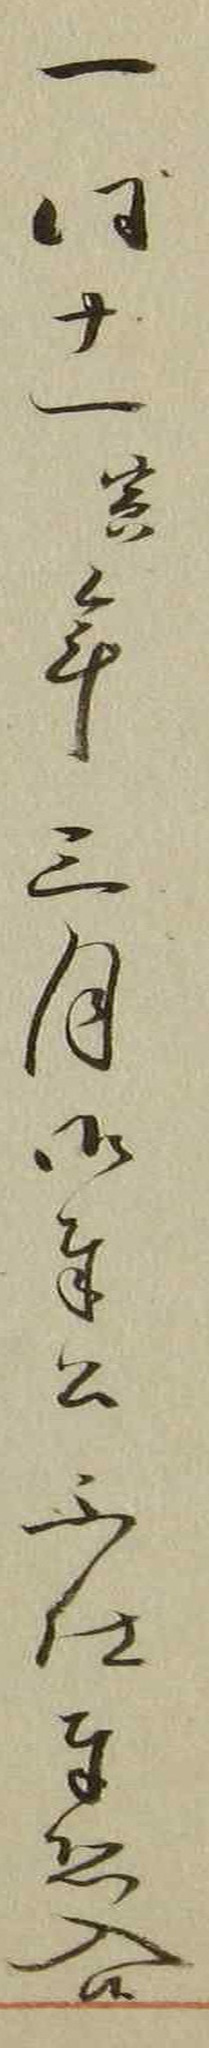一同十一寅年三月御奉公不仕奉恐入候
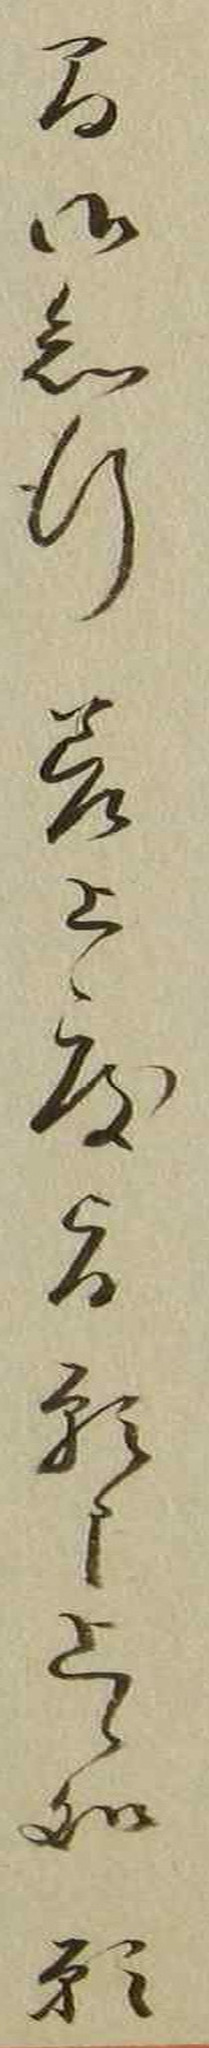間御知行差上度旨願申上候処願
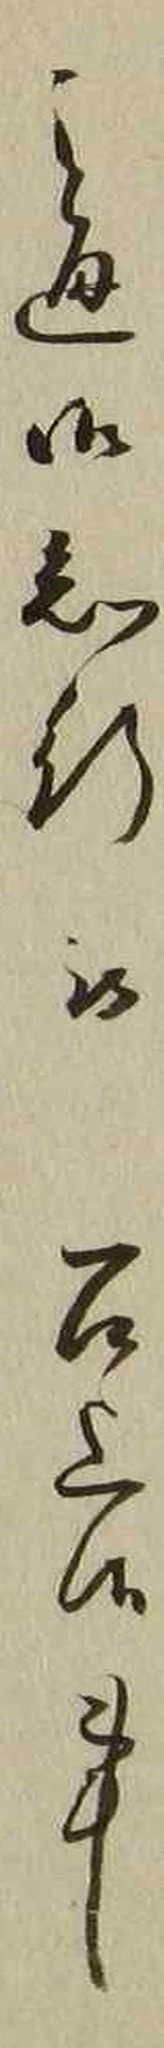之通御知行被召上候事
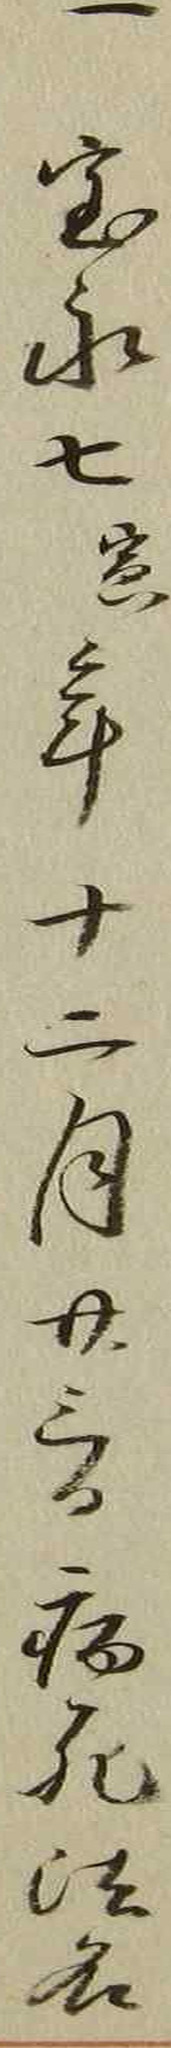一宝永七寅年十二月廿三日病死法名
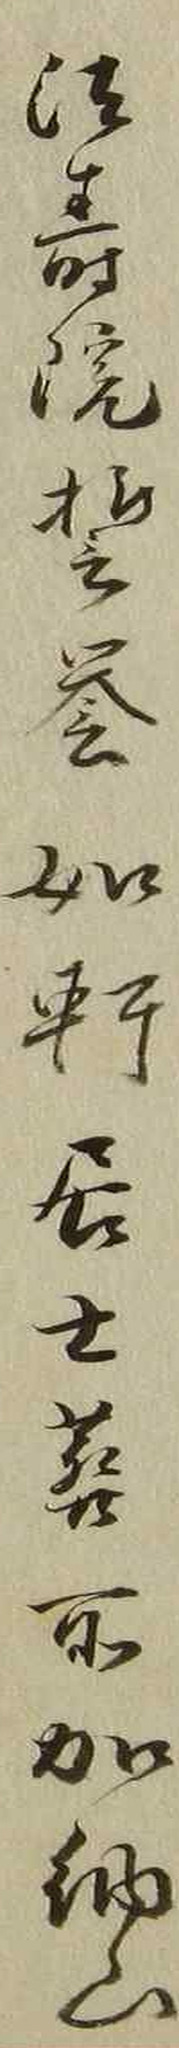法寿院誓誉如軒居士葬所加納山
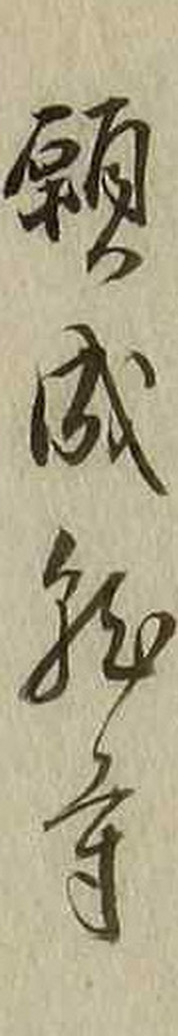願成就寺
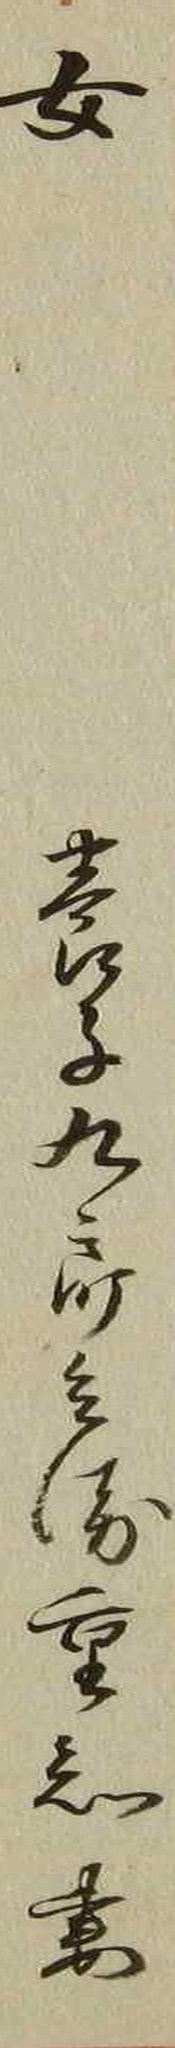女養子九郎兵衛重知妻
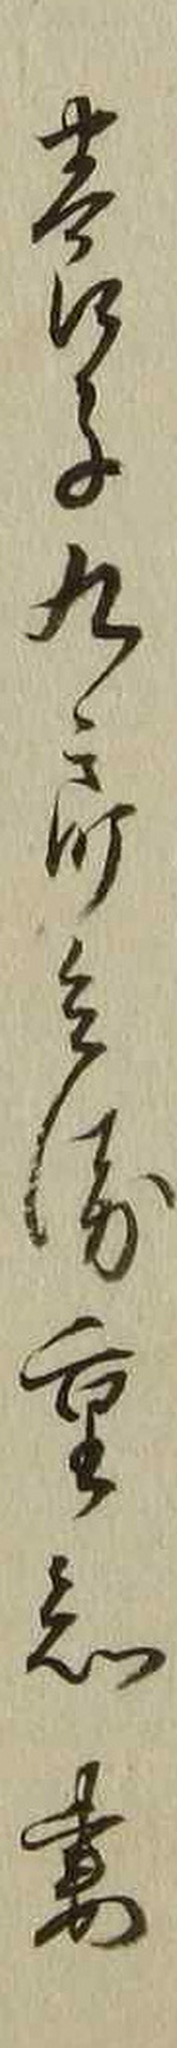女養子九郎兵衛重知妻
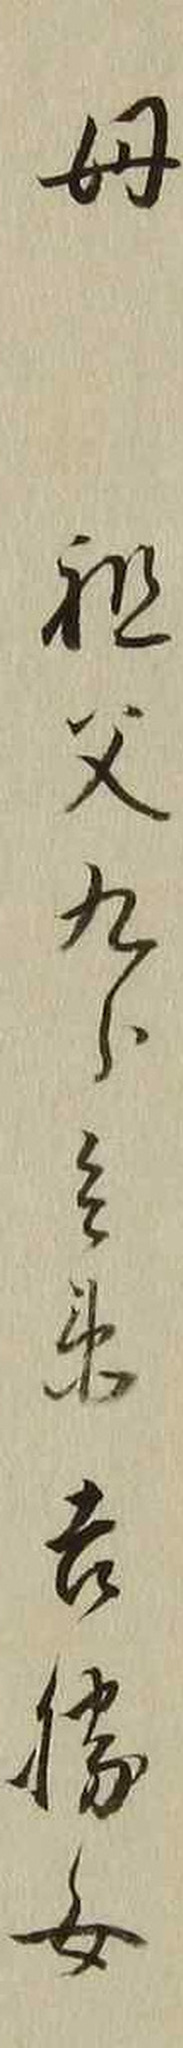母祖父九郎兵衛吉勝女
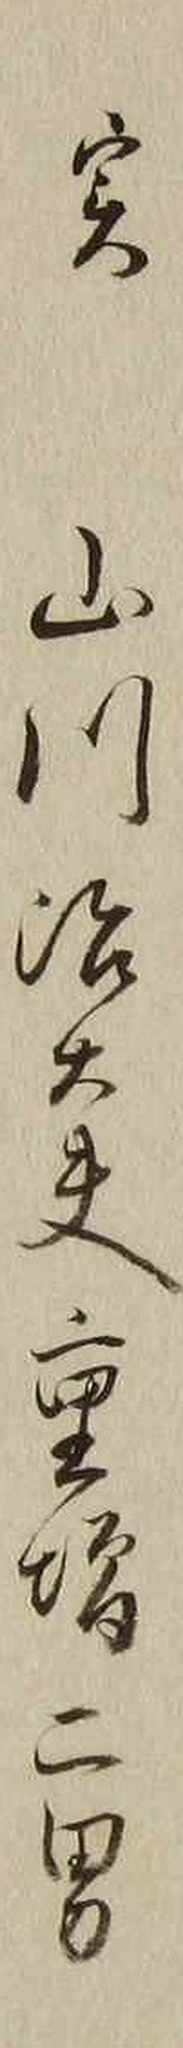実山川治大夫重増二男
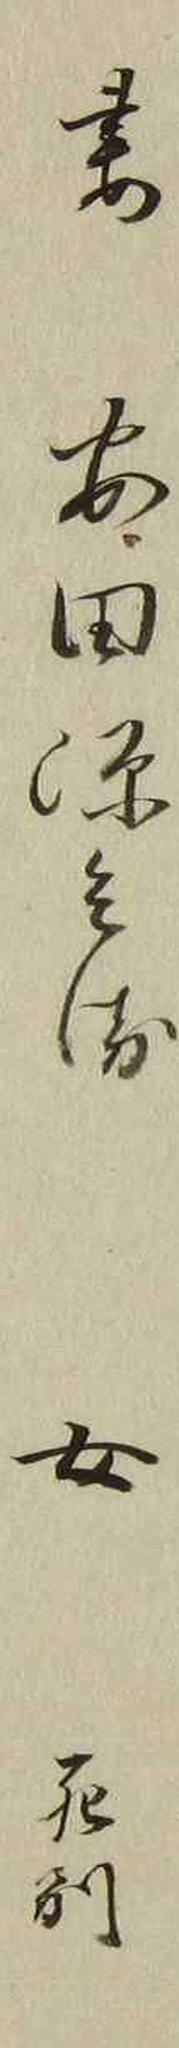妻安田源兵衛女死別
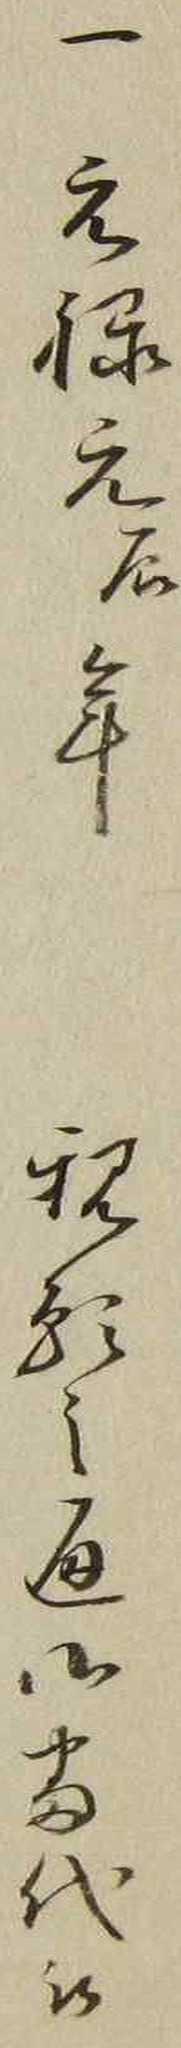一元禄元辰年親類之通御番代被
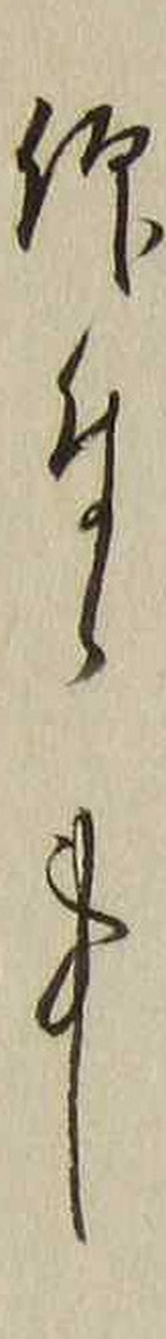仰付候事

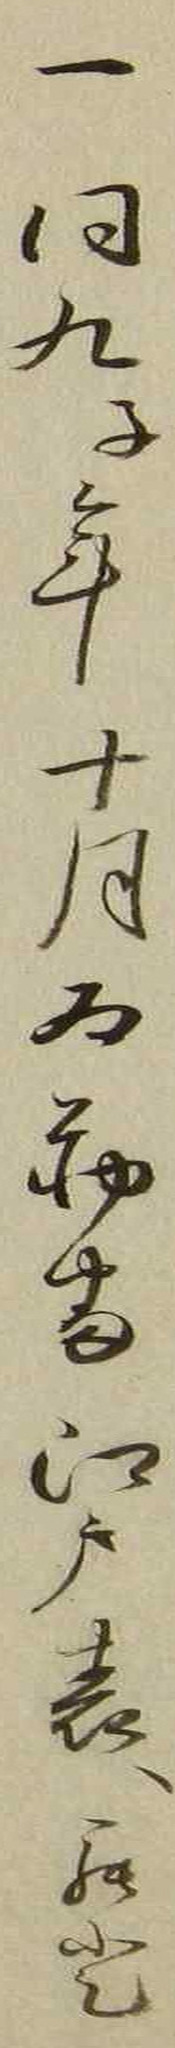一同九子年十月為勤番江戸表へ罷登
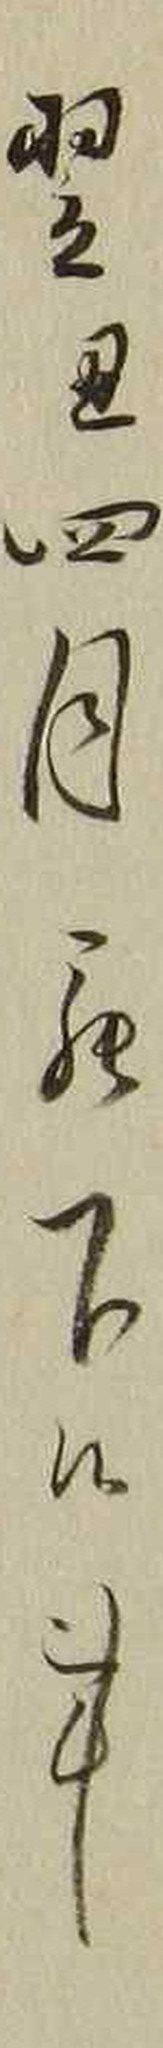翌丑四月罷下候事
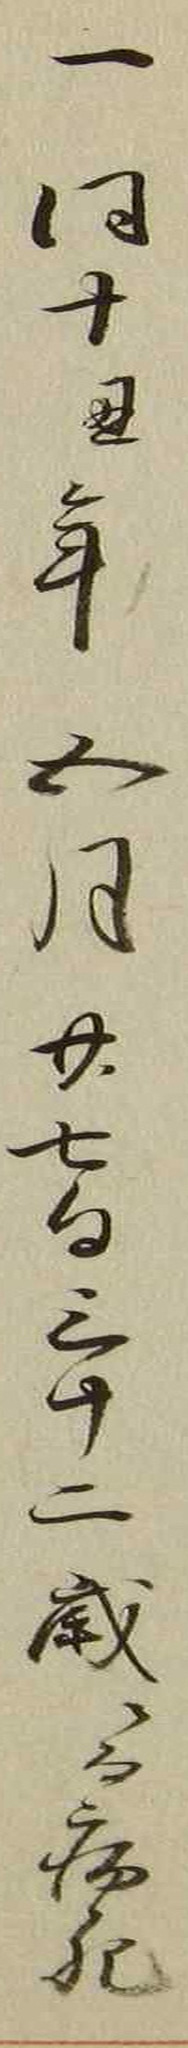一同十丑年五月廿七日三十二歳ニ而病死
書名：諸士系譜　巻之32　い之部32
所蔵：会津若松市立会津図書館
